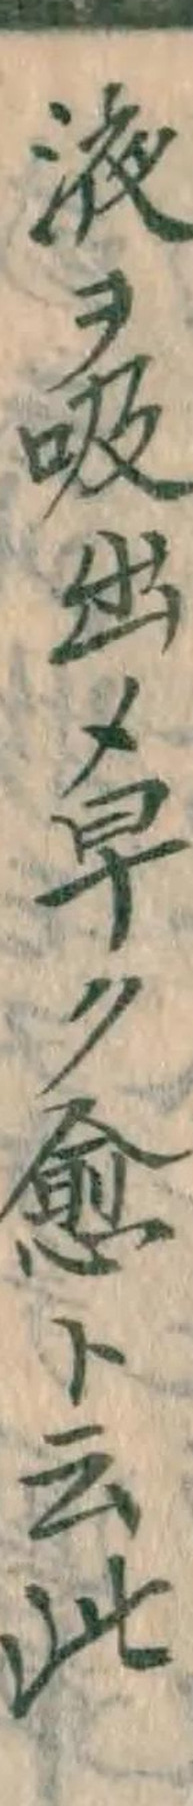液ヲ吸出シテ早ク愈ト云此
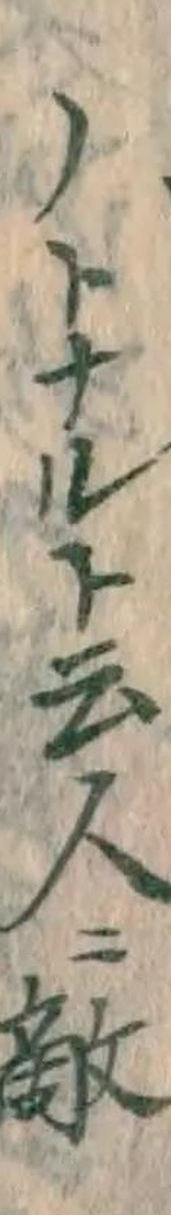ノトナルト云人ニ敵
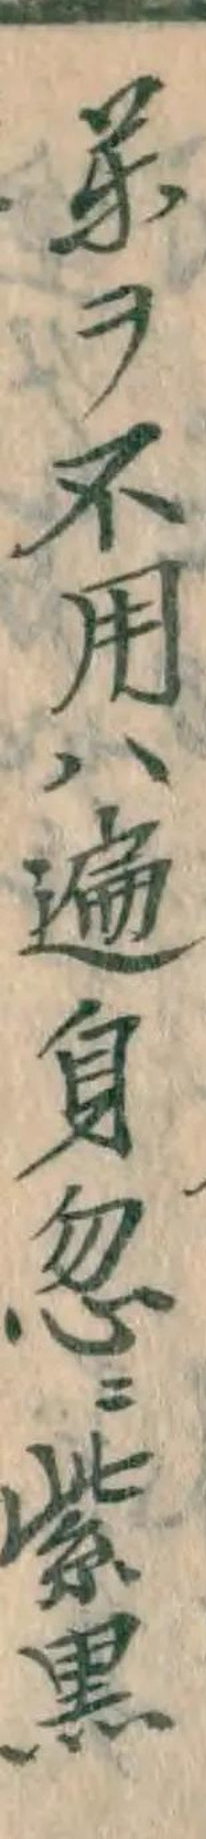薬ヲ不用ハ遍身忽ニ紫黒
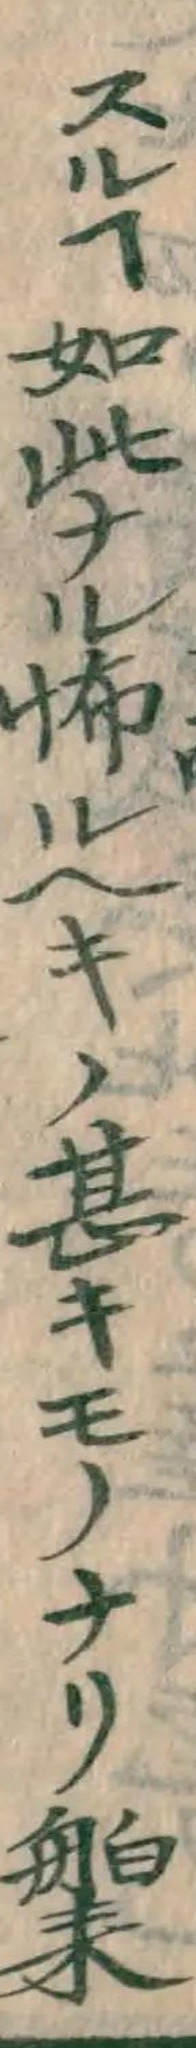スルコト如此ナル怖ルヘキノ甚キモノナリ舶来
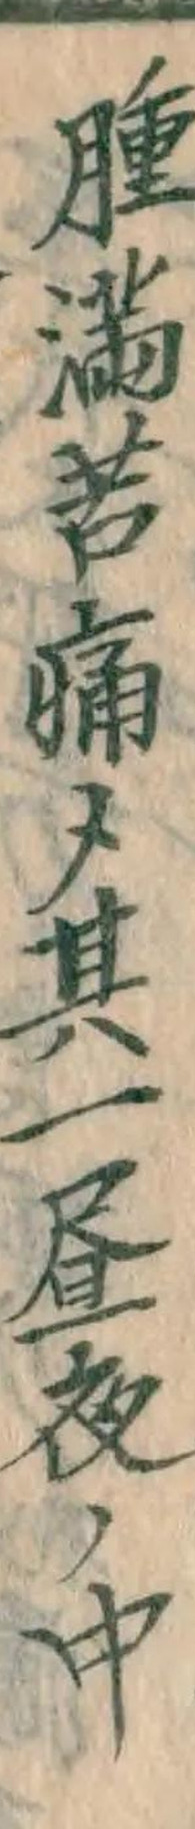腫満苦痛シテ其一昼夜ノ中
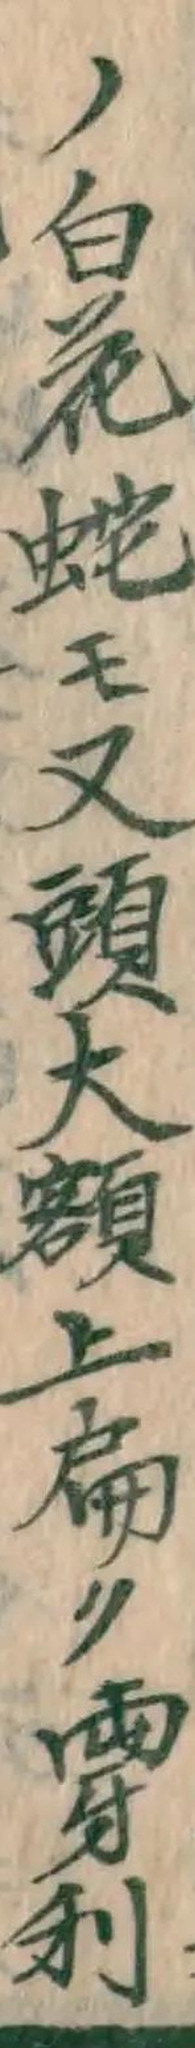ノ白花蛇モ又頭大額上扁ク両牙利
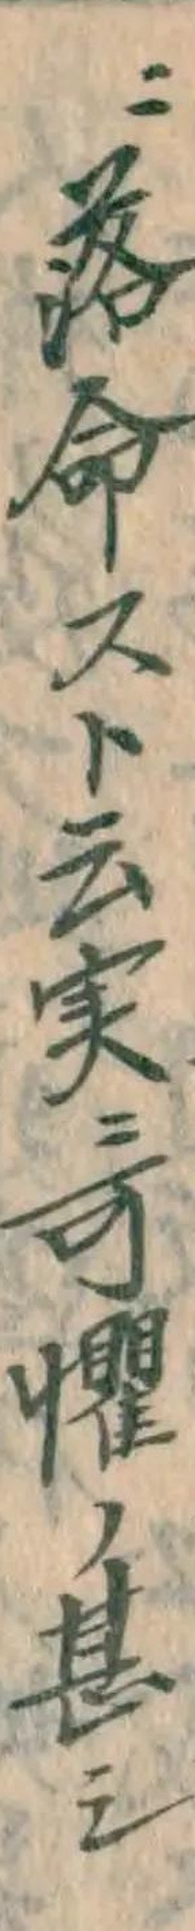ニ落命スト云実ニ可懼ノ甚シ
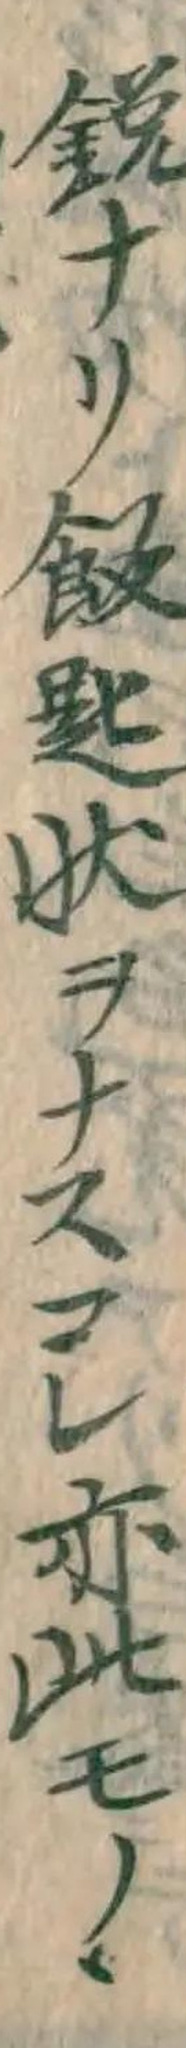鋭ナリ飯匙状ヲナスコレ亦此モノヽ
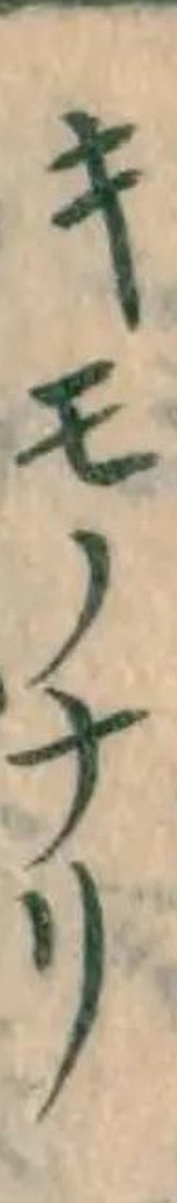キモノナリ
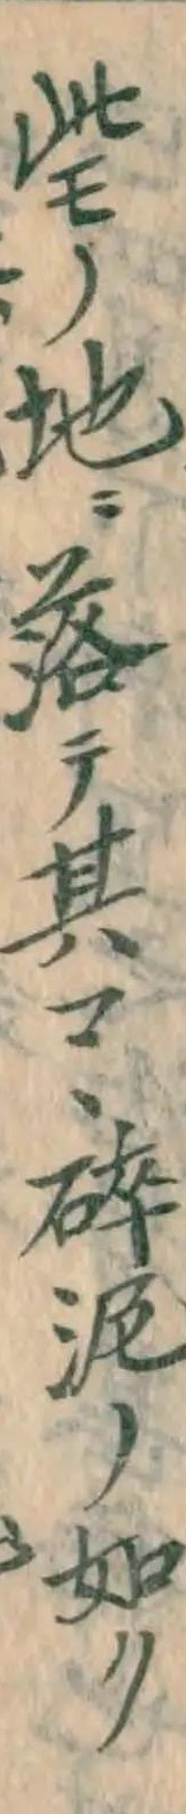此モノ地ニ落テ其マヽ碎泥ノ如ク
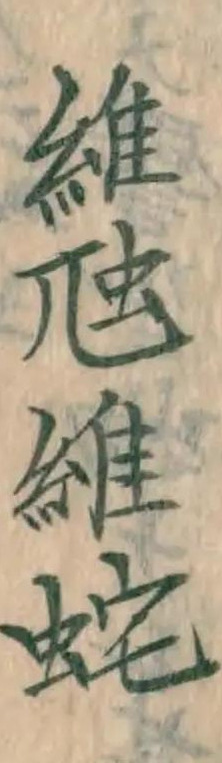維虺維蛇
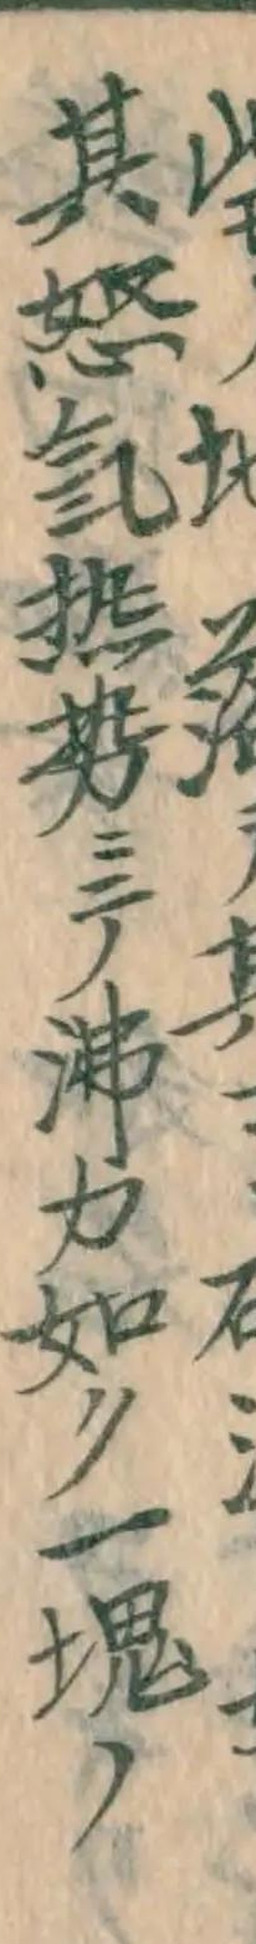其怒気熱勢ニテ沸カ如ク一塊ノ

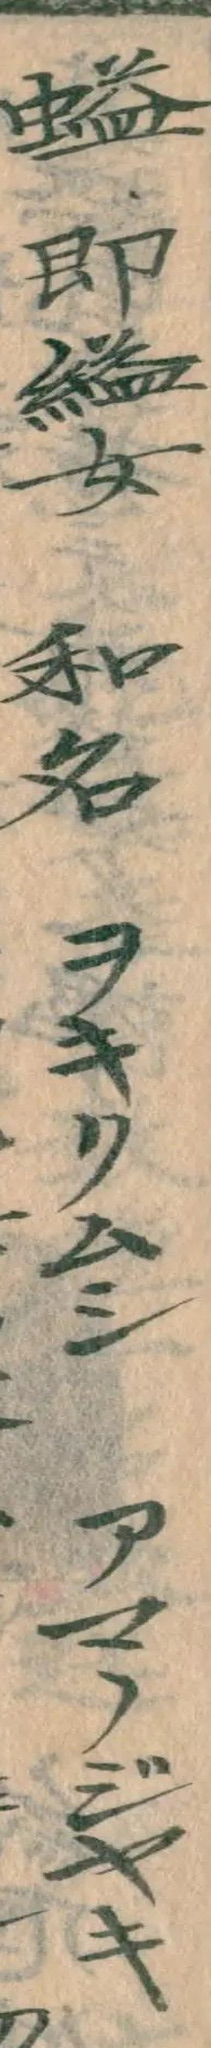螠即縊女和名ヲキクムシアマノジヤキ
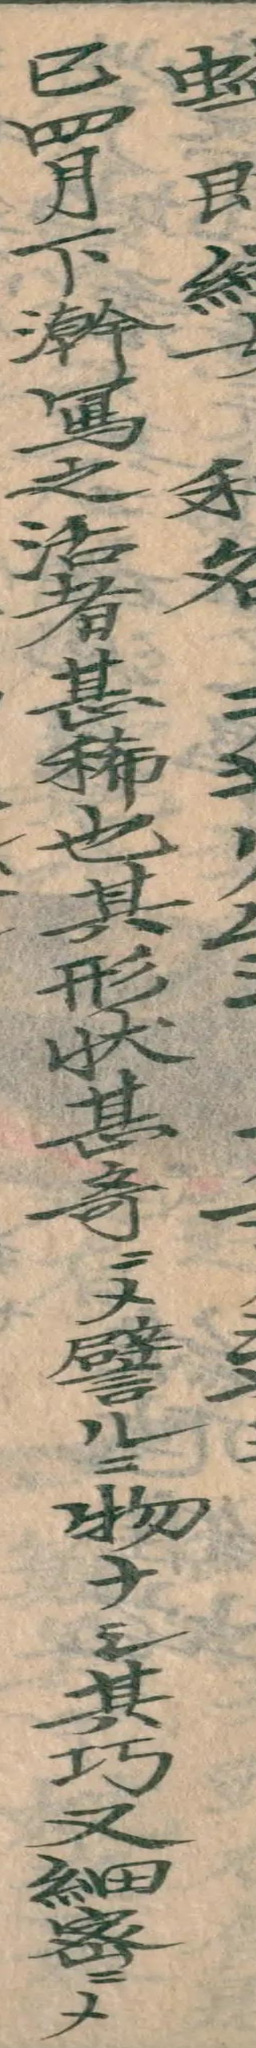巳四月下澣写之活者甚稀也其形状甚奇ニシテ譬ルニ物ナシ其巧又細密ニシテ
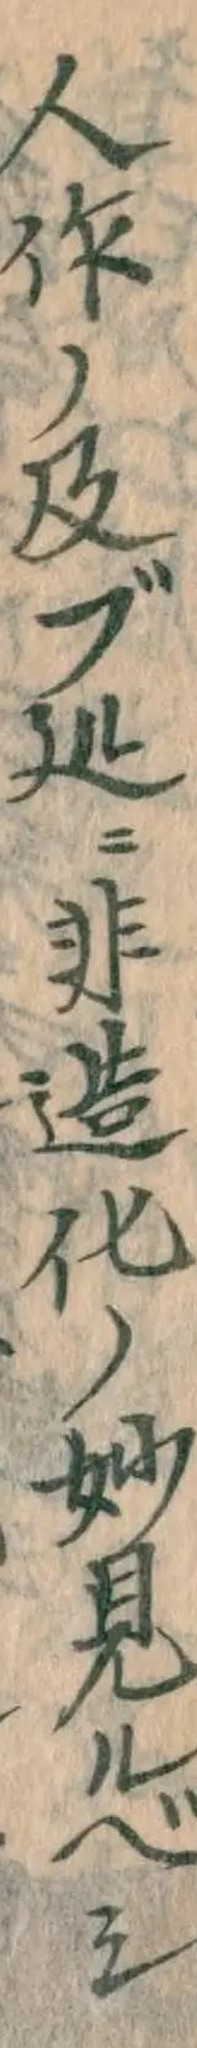人作ノ及ブ処ニ非造化ノ妙見ルベシ
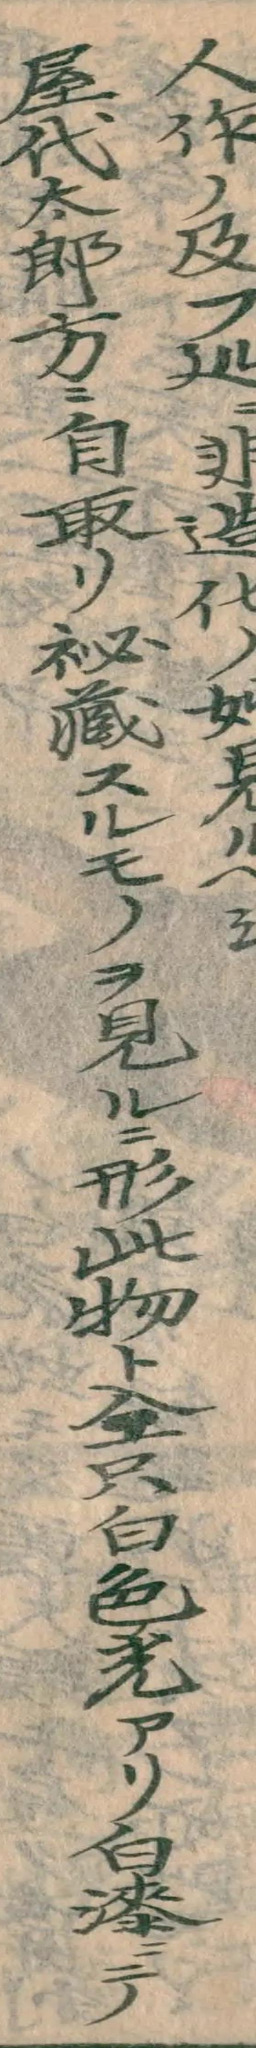屋代太郎方ニ自取リ秘蔵スルモノヲ見ルニ形此物ト仝只白色光アリ白漆ニテ
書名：千蟲譜 3巻. [3]
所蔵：国立国会図書館 National Diet Library, JAPAN
